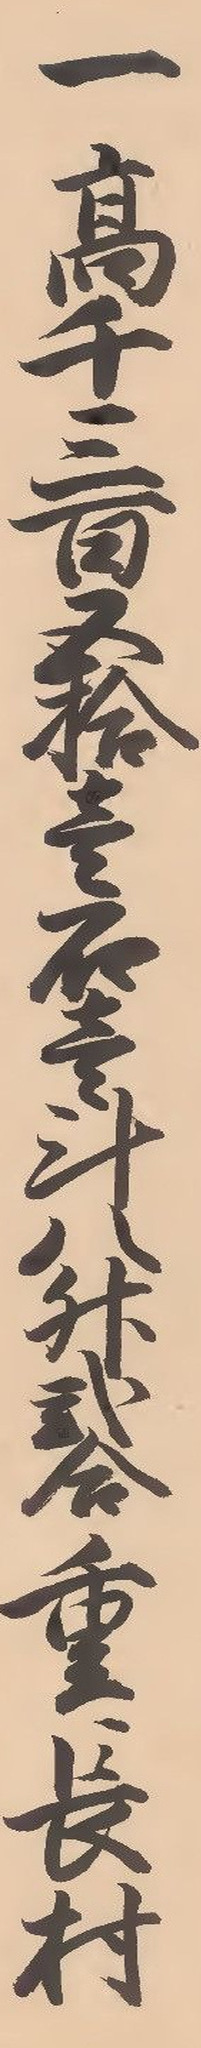一高千三百五拾壱石壱斗八升弐合重長村
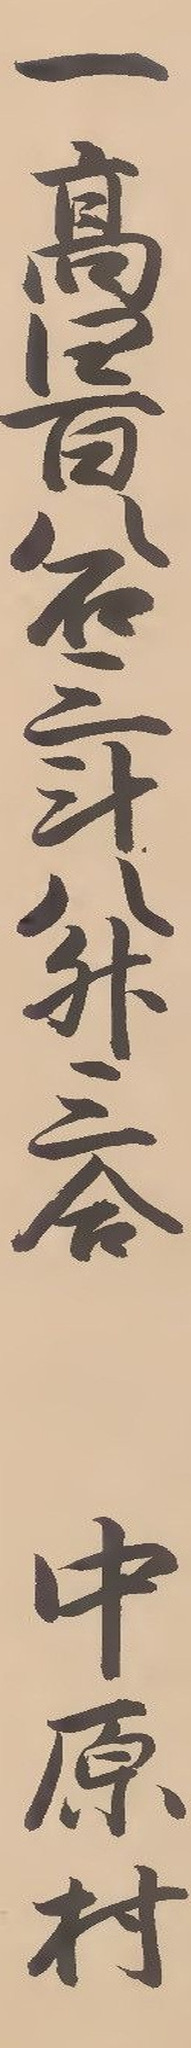一高四百八石三斗八升三合中原村
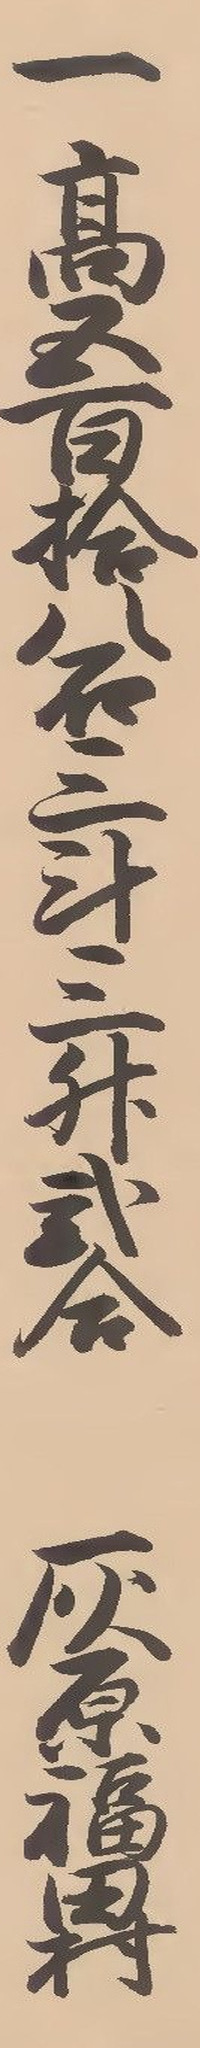一高五百拾八石三斗三升弐合灰原福田村
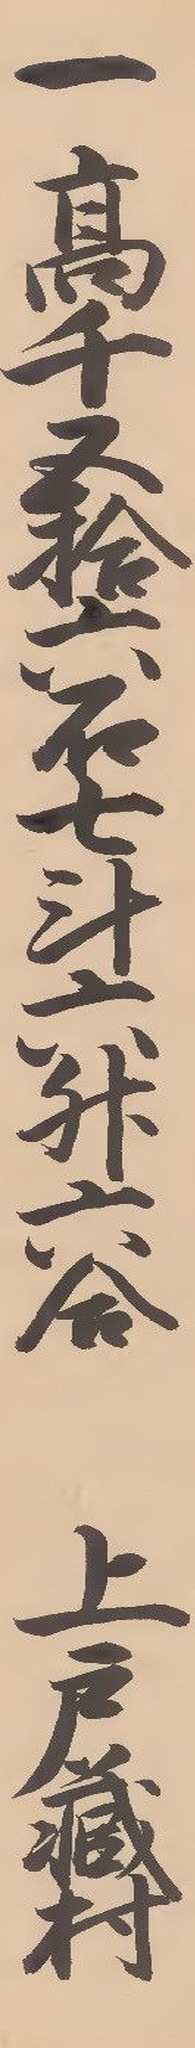一高千五拾六石七斗六升六合上戸蔵村
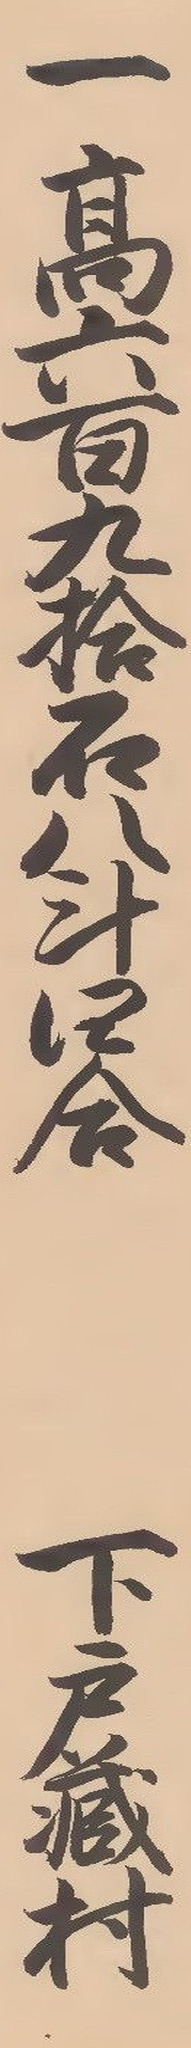一高六百九拾石八斗四合下戸蔵村

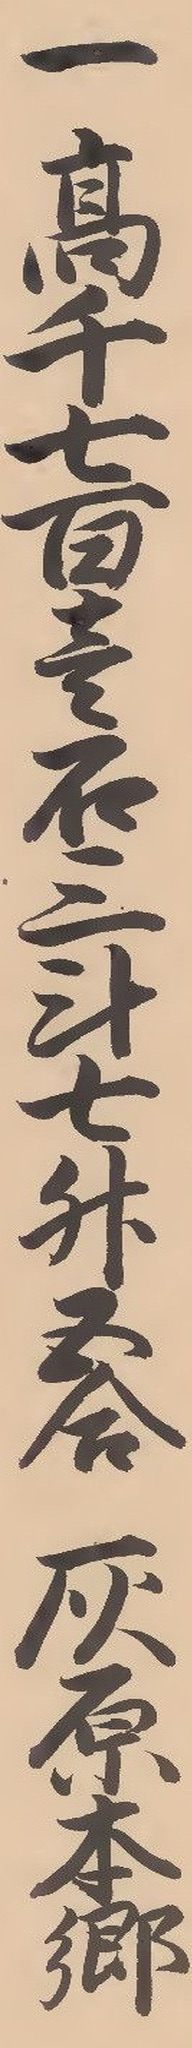一高千七百壱石三斗七升五合灰原本郷
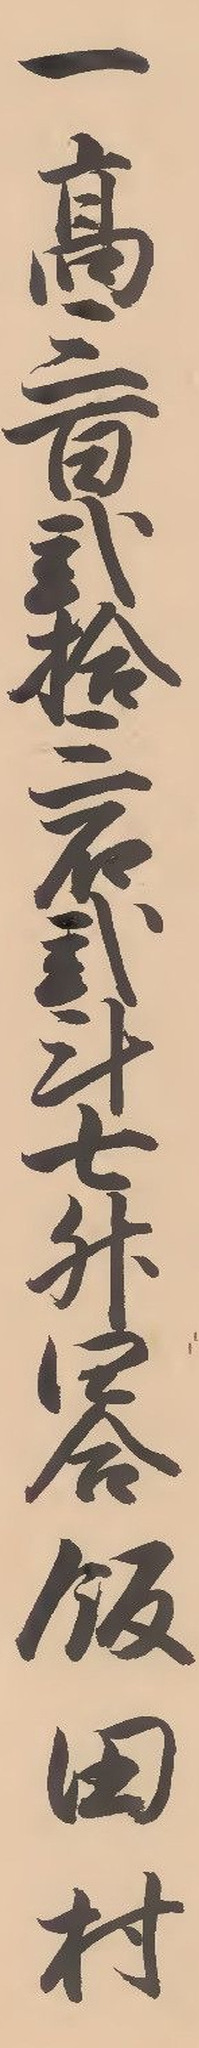一高三百弐拾三石弐斗七升四合飯田村
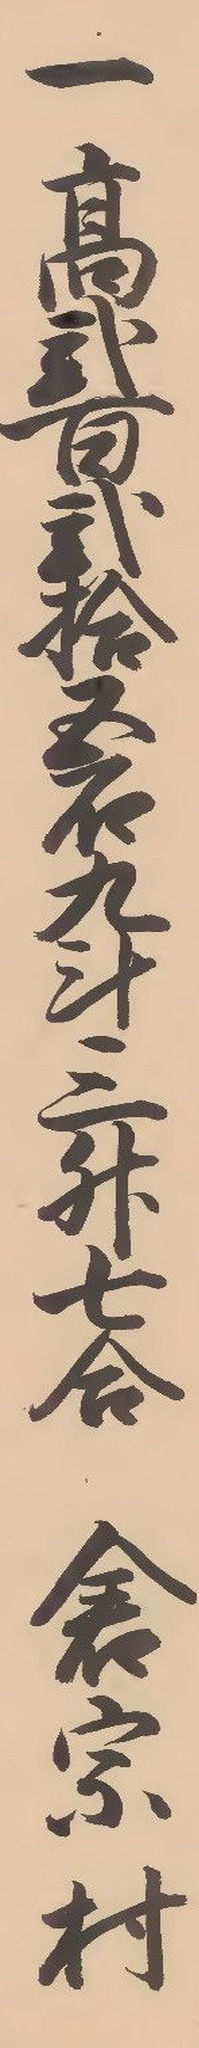一高弐百弐拾五石九斗三升七合倉宗村
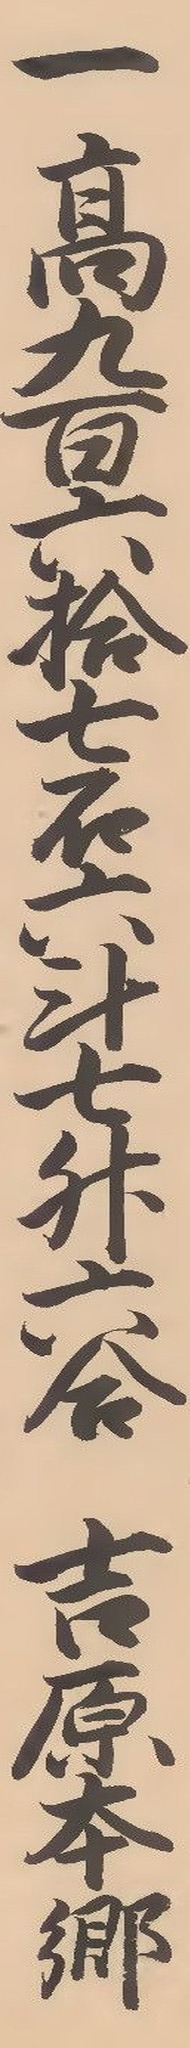一高九百六拾七石六斗七升六合吉原本郷
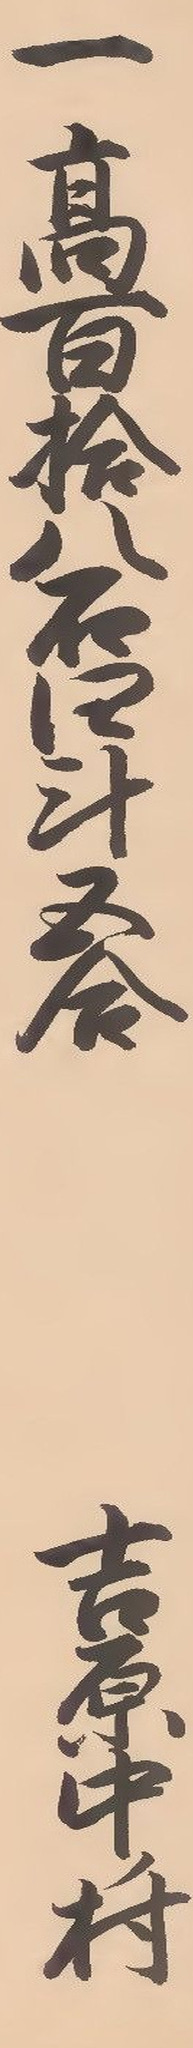一高百拾八石四斗五合吉原中ノ村
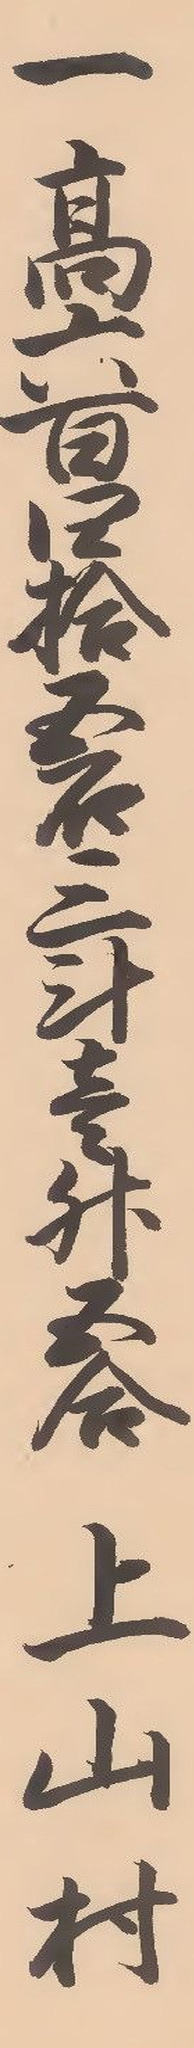一高六百四拾五石三斗壱升五合上山村
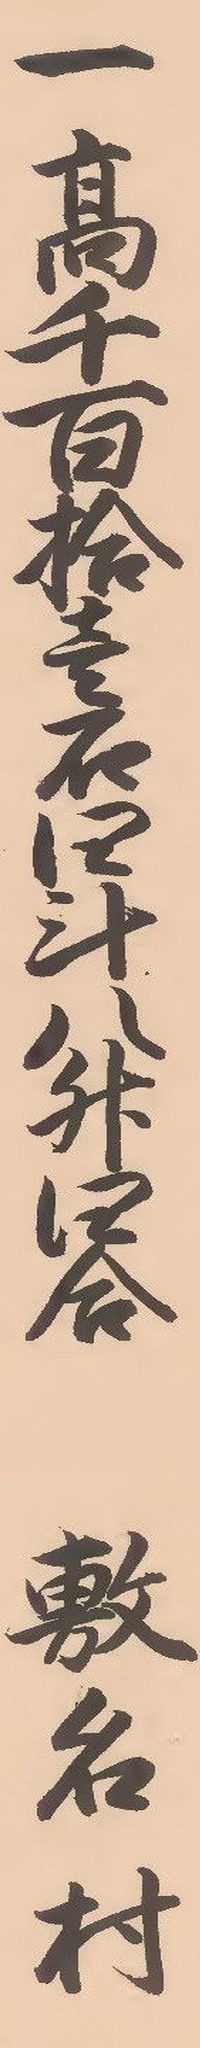一高千百拾壱石四斗八升四合敷名村

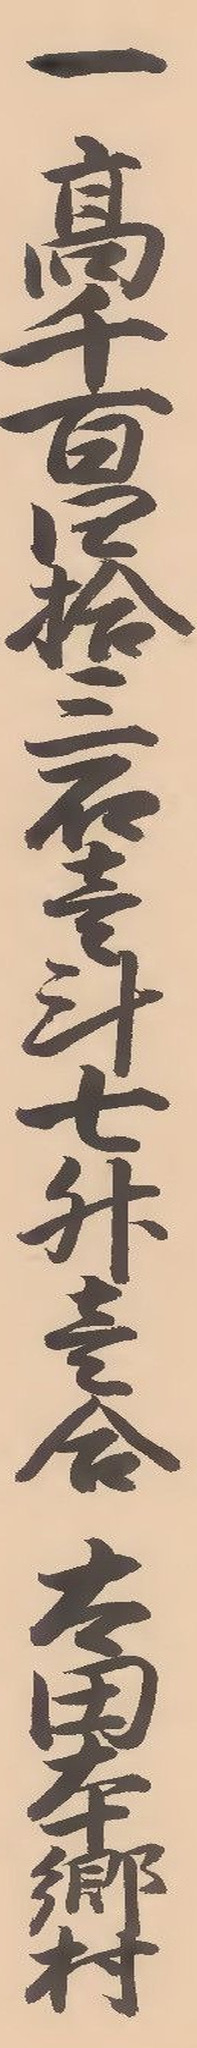一高千百四拾三石壱斗七升壱合太田本郷村
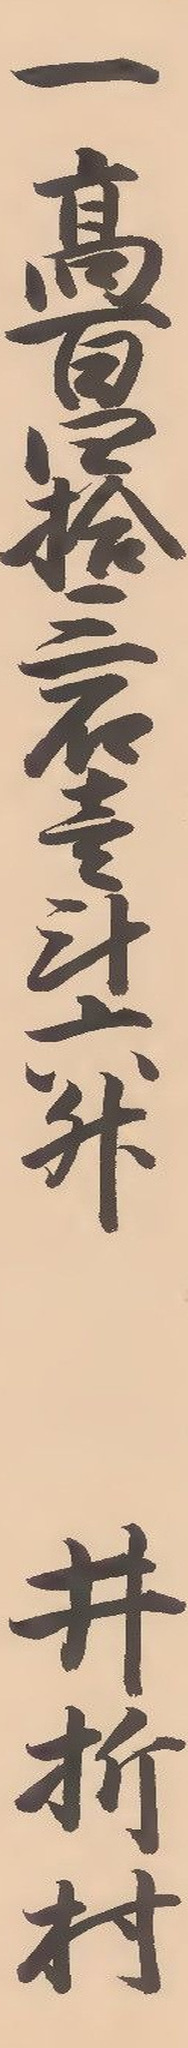一高百四拾三石壱斗六升井折村
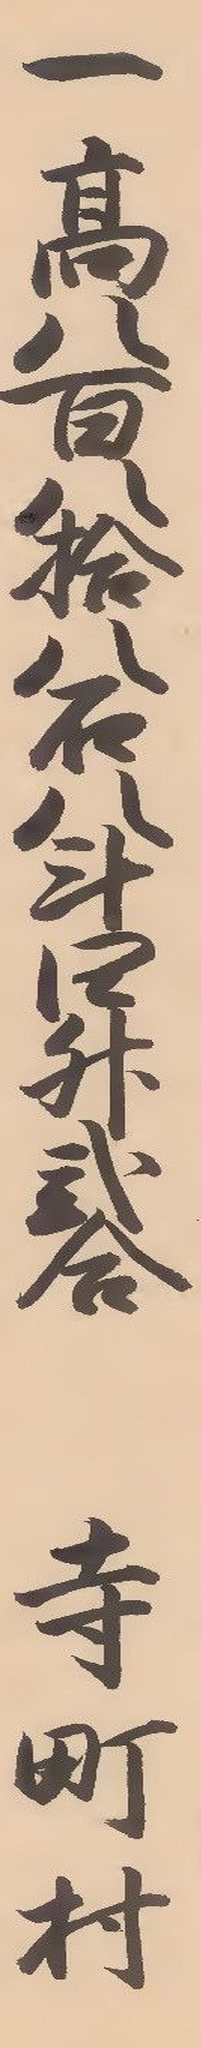一高八百八拾八石八斗四升弐合寺町村
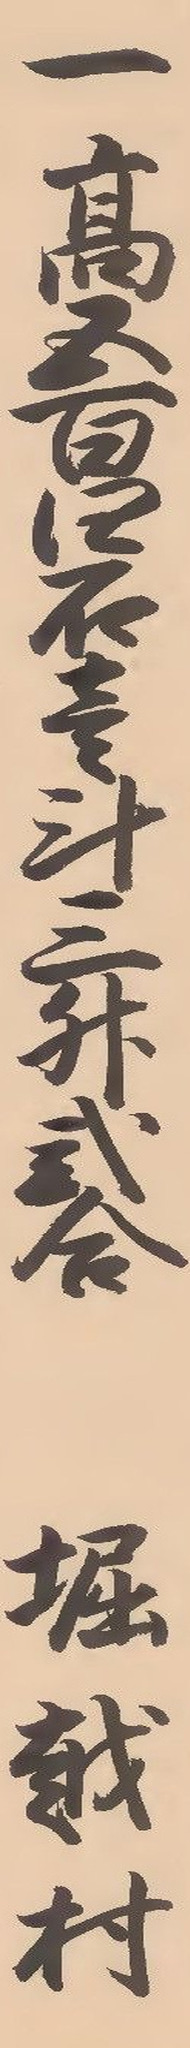一高五百四石壱斗三升弐合堀越村
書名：備後国郷帳
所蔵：国立公文書館 National Archives of Japan
